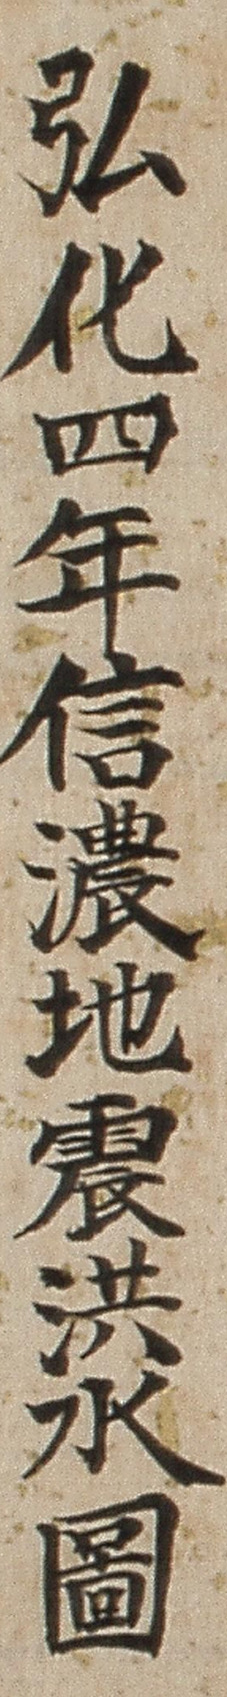弘化四年信州地震洪水図

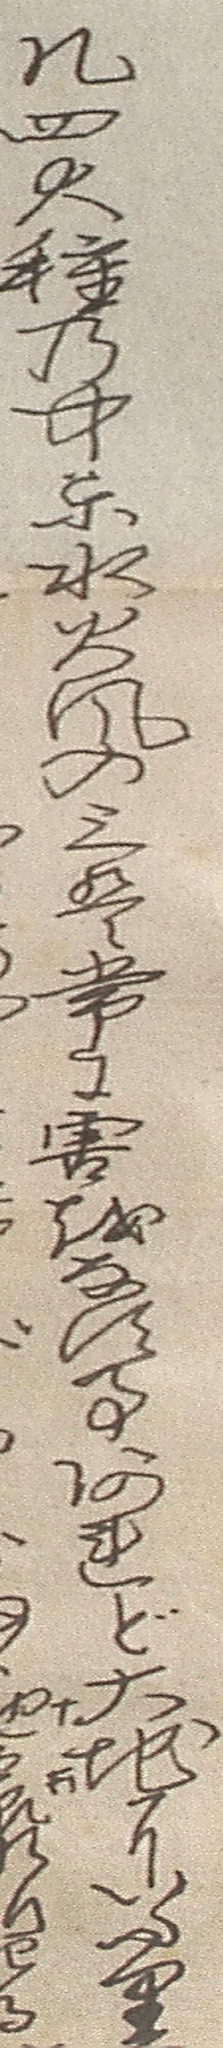凡四大種の中に水火風の三は常に害をなす事あれど大地にいたりては殊なる
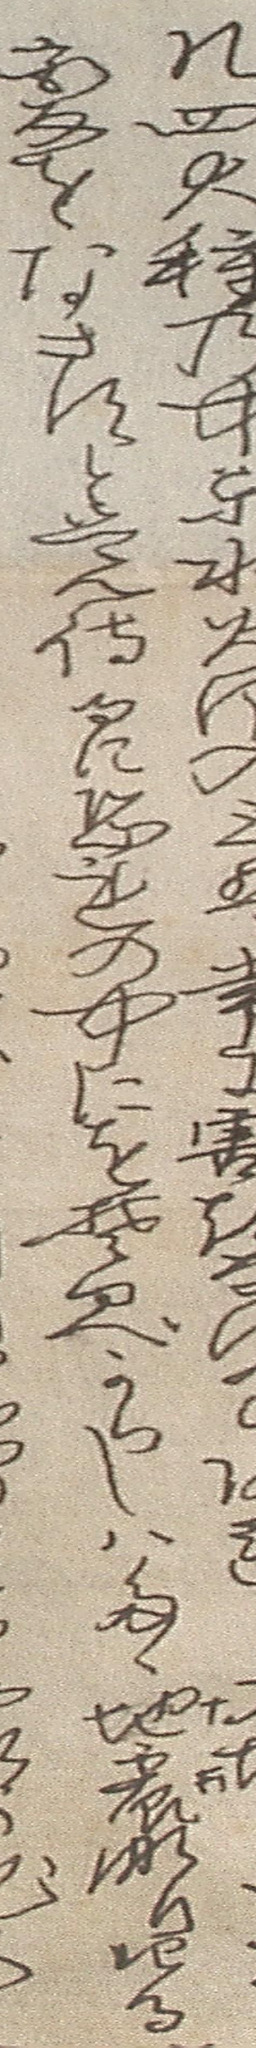変をなさすと覚侍るに恐れの中にをそるべからしは多く地震なりける以上長明
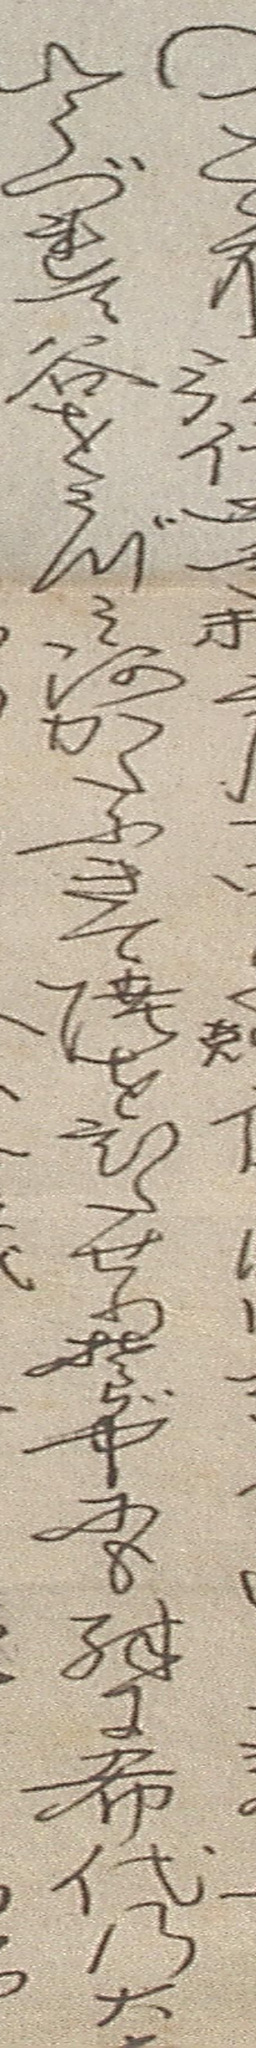山くづれて谷をうずみ河かたふきて陸をひたせりそが中にも稀代の大変と
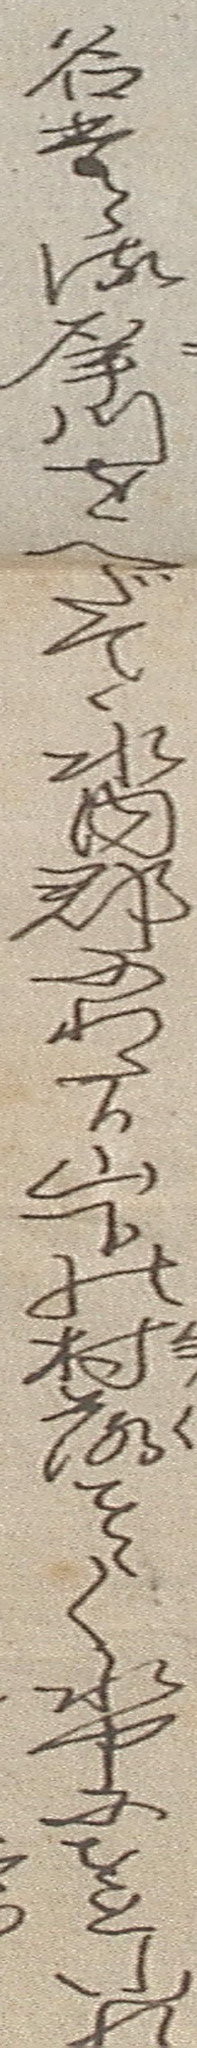名たゝる犀川をへだてゝ水内郡にわたり山下の村落こと〳〵く水中にをとしいれ岩石
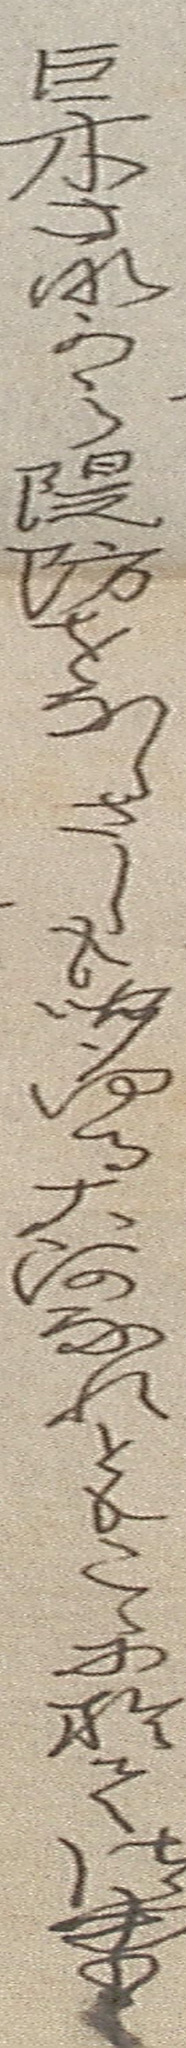巨木さなから堤防をなしさしも聞ゆる大河なれともこゝに於てつゆのはす事
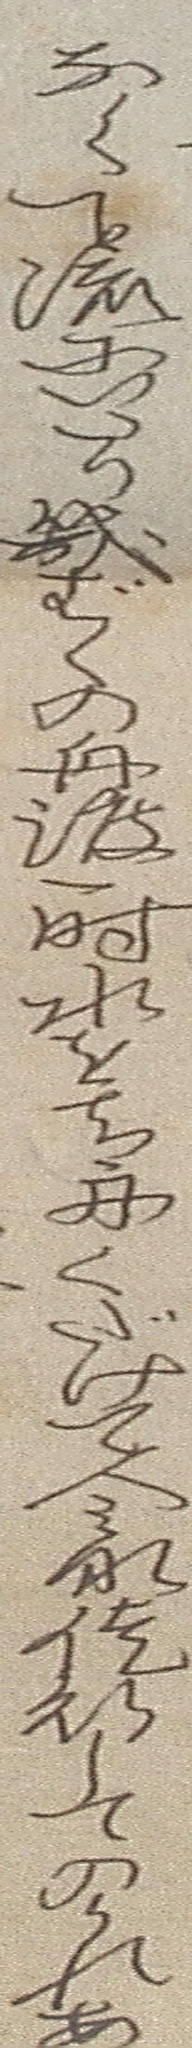なく下流にいたり幾ばくの舟渡一時水をち舟くだけて人みな徒行してのかれあへて
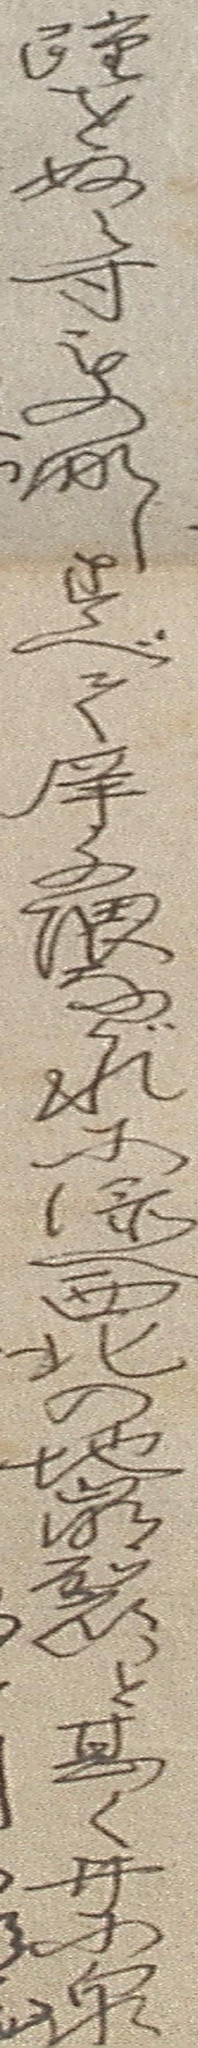踵をぬらすものなしすべて犀千隈ながれに添へ西北の地崩裂いと甚く井に泉なく
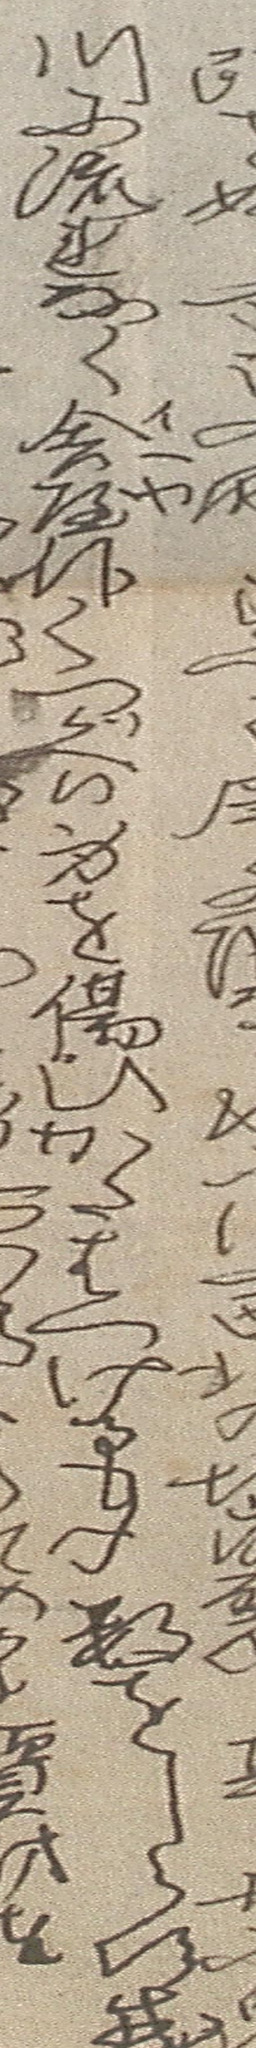川に流れなく舎屋抔くつがへり身を傷ひかたはつけるもの数をしらす或は
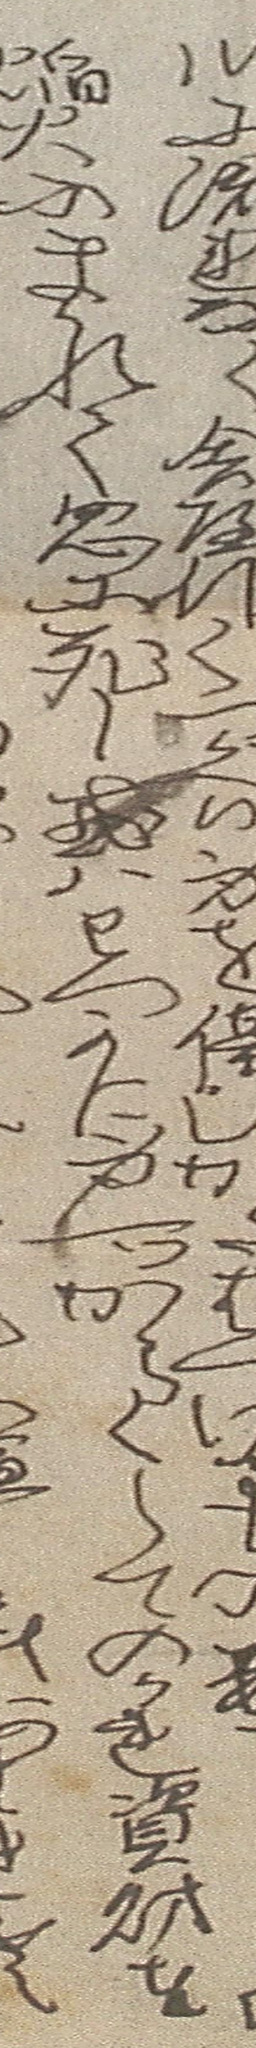焔火にまかれて忽に死し或はわつかに身一ツからくしてのかれ資財を
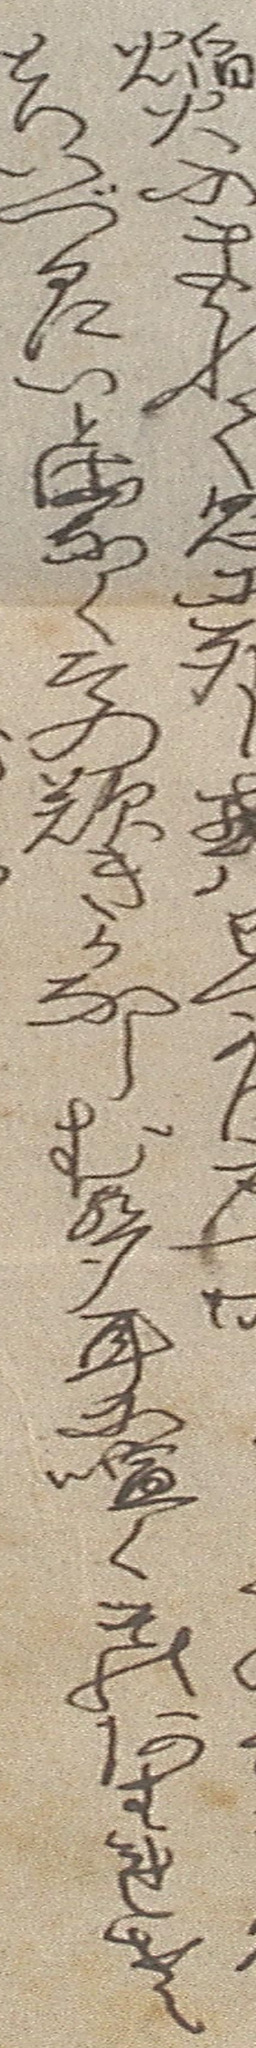とりいづるにいとまなくその歎きかなしむ声耳に喧くそのあはれさは
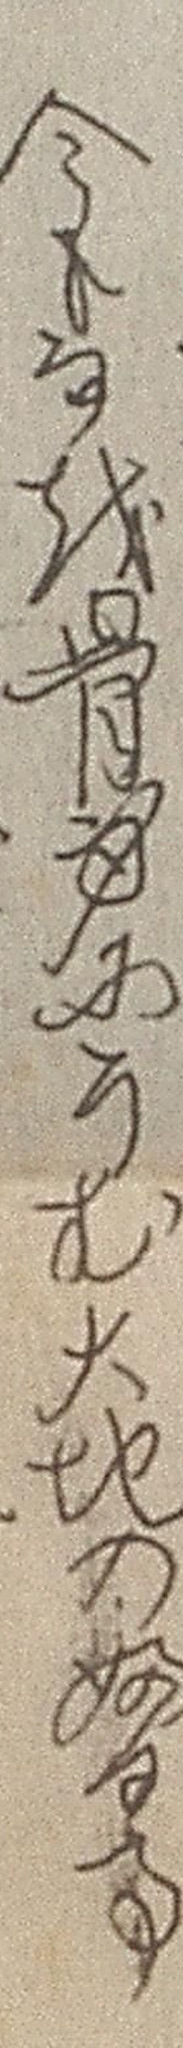今もなほ骨身にそむ大地のふる事
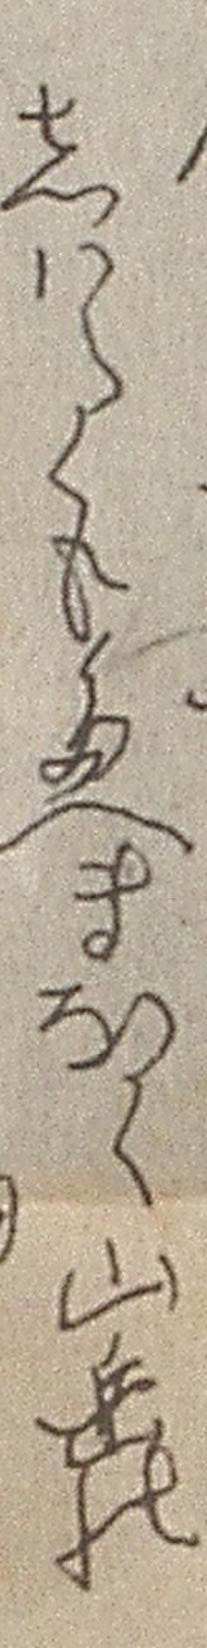しはらくもたへまなく山岳の
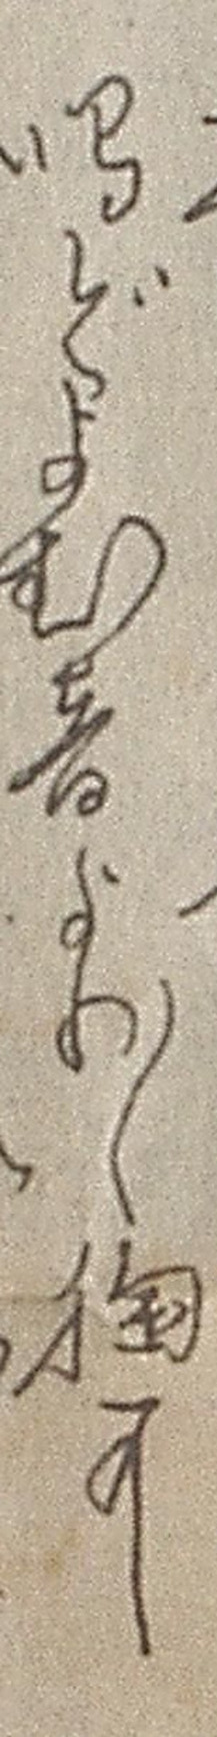鳴どよむ音によの〳〵掏に
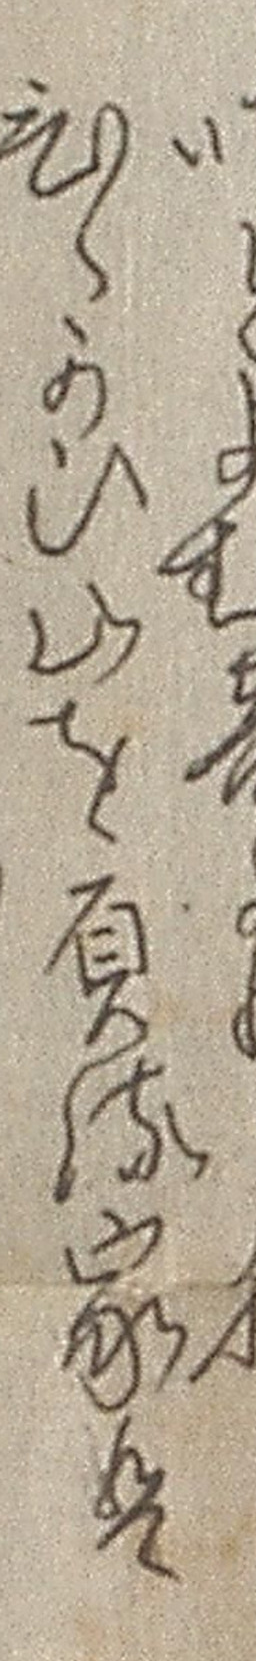ひたかひ山を負る家は
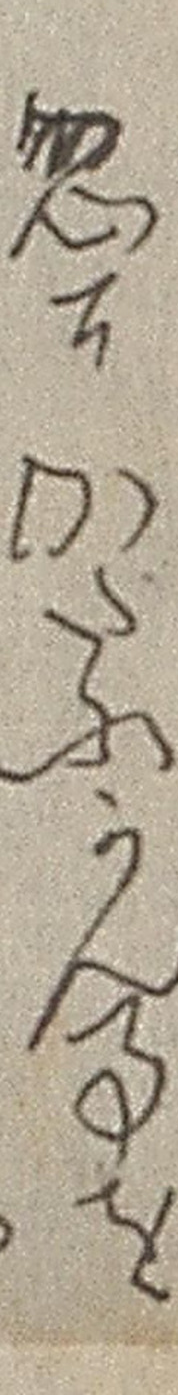忽にかたふかん事を
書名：弘化四年信濃地震洪水圖
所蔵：東京大学地震研究所図書室 Earthquake Research Institute Library, The University of Tokyo, JAPAN
